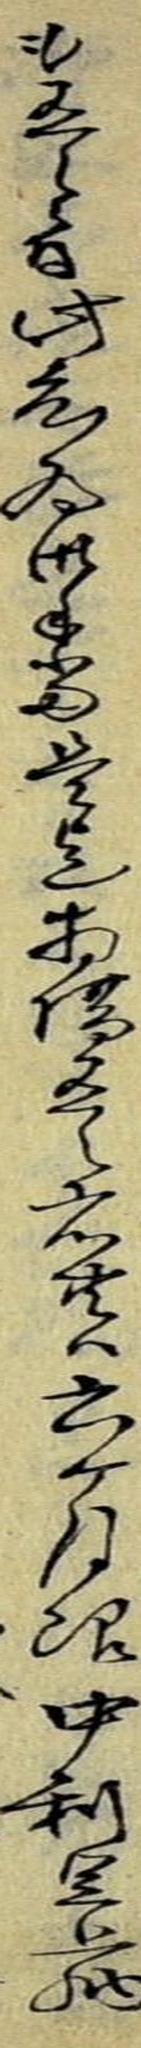も有之に付此度為御手当是迄拝借有之者共は六ヶ月限中利足上納
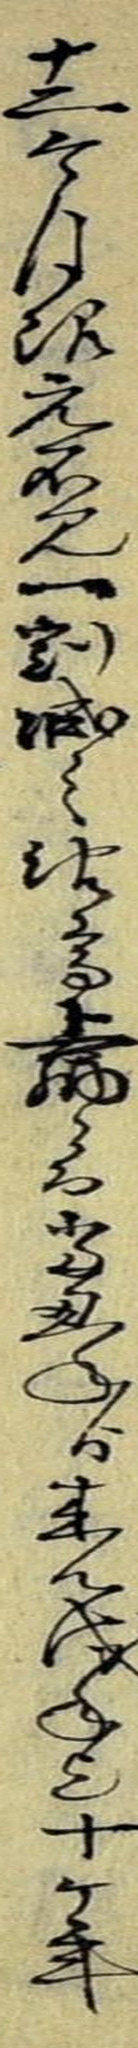十二ヶ月限元不見一割減之銀高上納に而当丑年ゟ来ル戌年迄十ヶ年
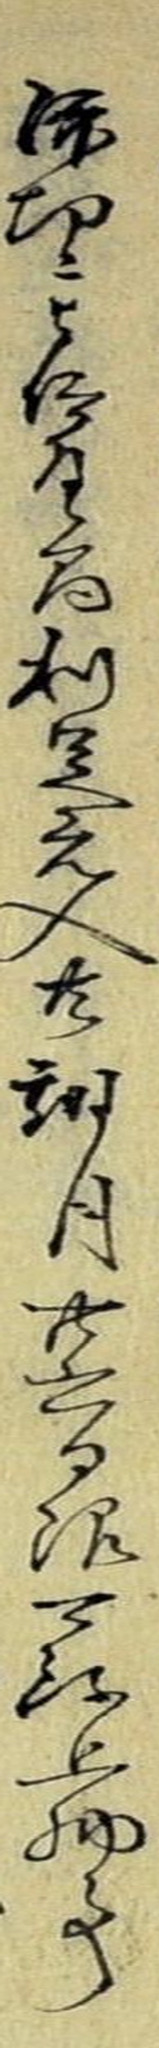済切に被仰付候間利足元入共朔月廿六日限可致上納事
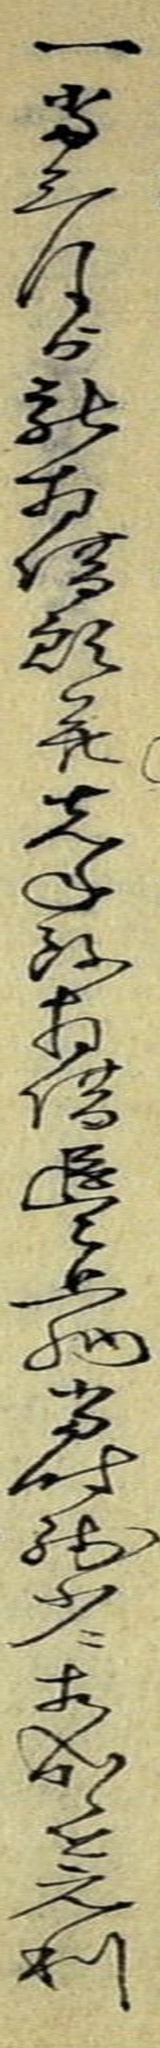一当三月ゟ新拝借願并先年致拝借追々上納当時残少に相成候を元利
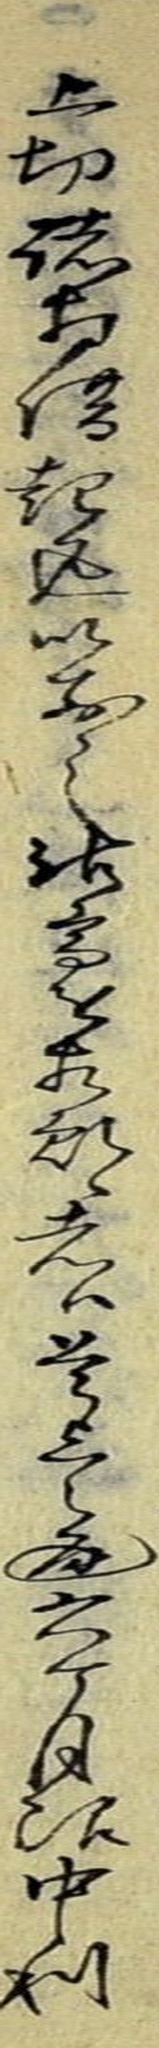上切諸拝借起返以前之銀高を相願候者は是迄之通六ヶ月限中利
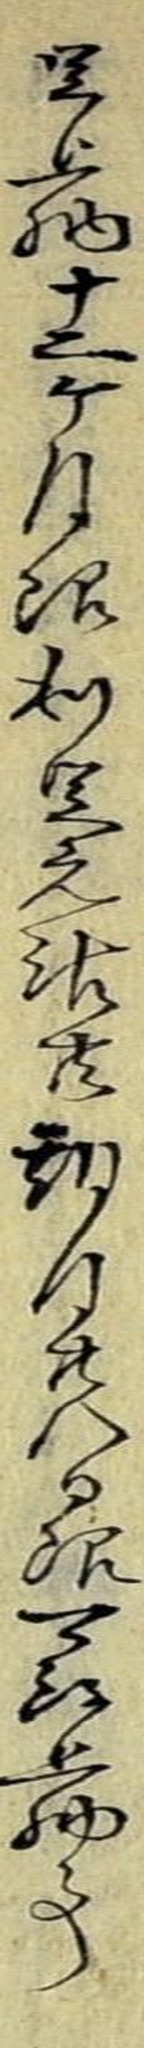足上納十二ヶ月限利足元銀共朔月廿八日限可致上納事
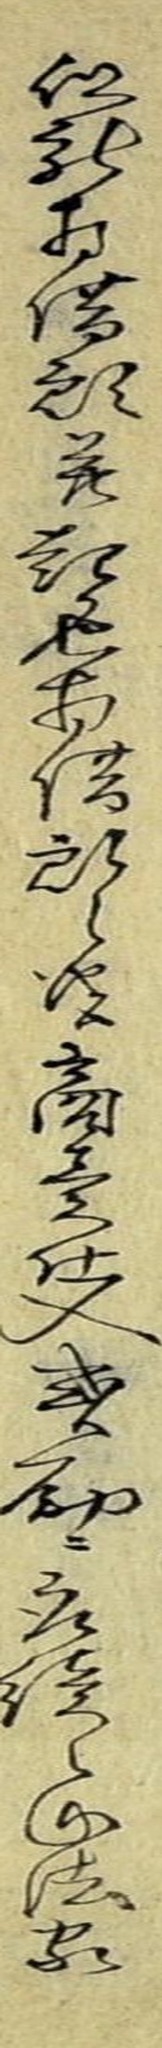但新拝借願并起返拝借願之儀は商売仕入或は励に取続候趣法家
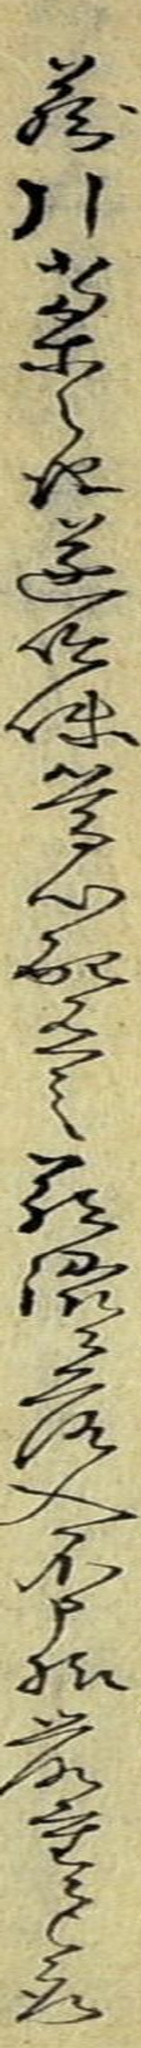蔵引当等之儀遂吟味等心配有之難渋に落入不申様厳重に被取
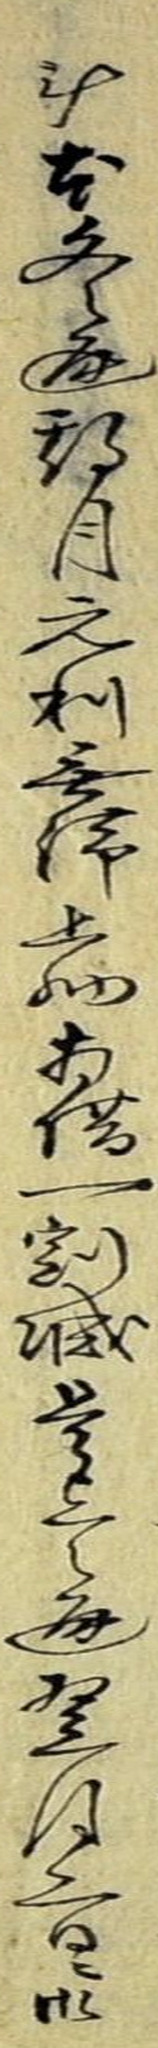斗本文之通朔月元利無滞上納拝借一割減是迄之通翌月二日に御
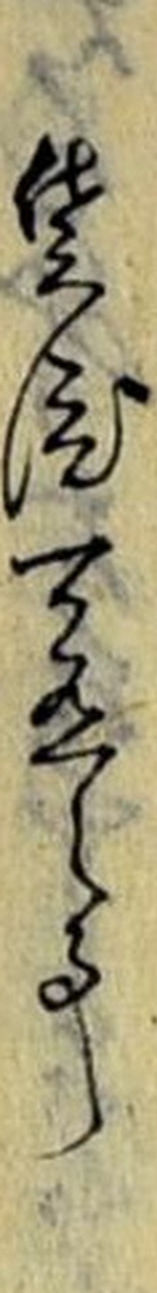貸渡可有之事
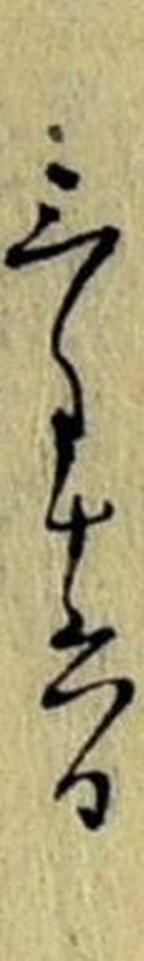三月十六日

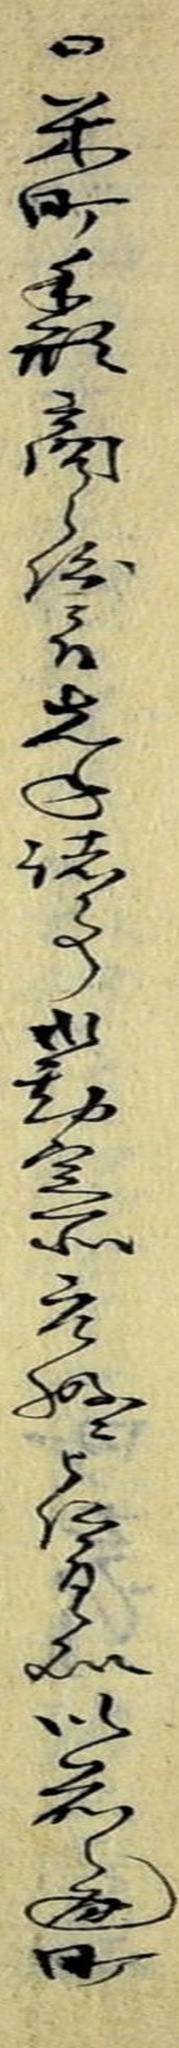○米町手形商之儀に付先年諸事御勘定所取扱に被仰付候処以前之通町
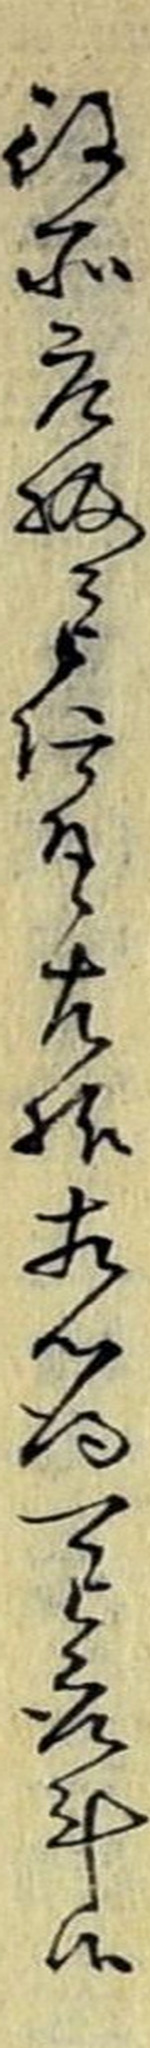役所取扱に被仰付候左様相心得可被取斗候
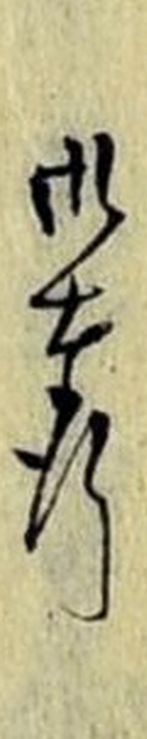御奉行
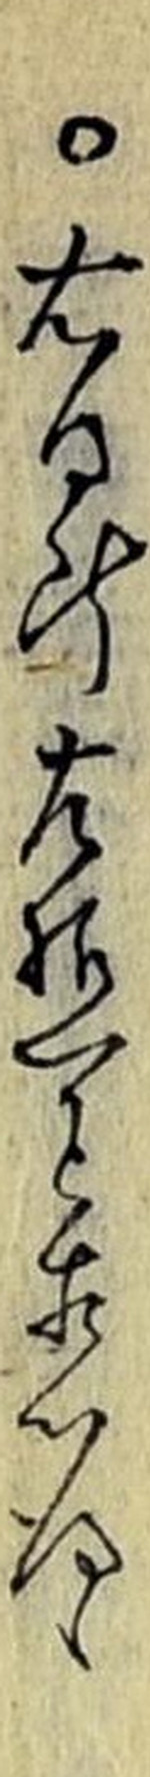○右同断左様可被相心得候
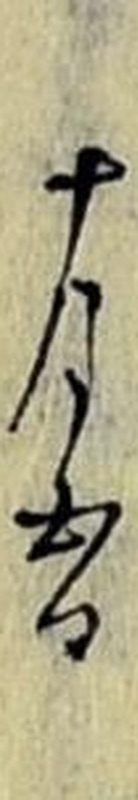十月五日
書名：命令之部 四
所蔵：福井県文書館 Fukui Prefectural Archives
